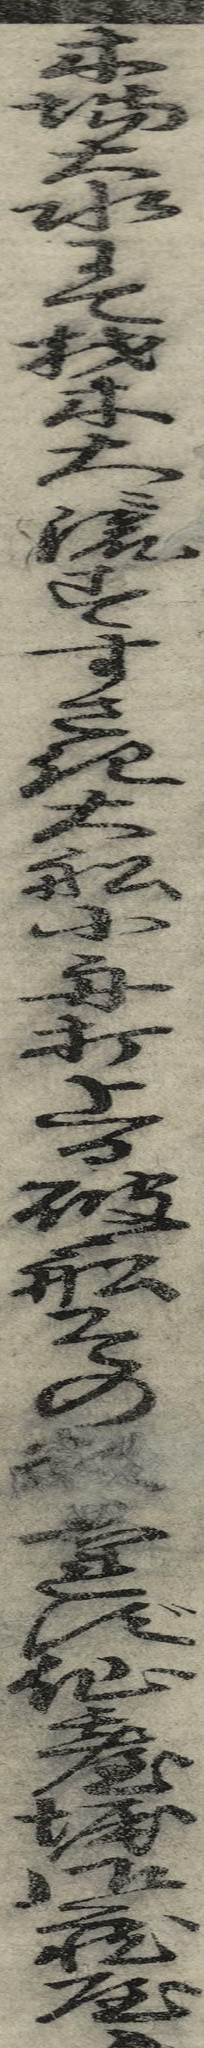本坊大水にて材木大二流すすさき大船小舟打上る破船その数しれず仙台堀御蔵屋
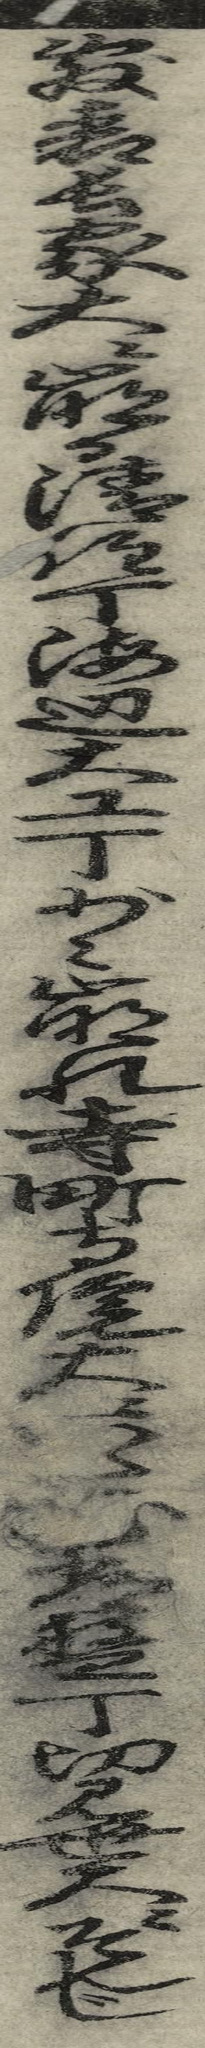敷表長家大二崩る清住丁海辺大工丁少々崩れ寺町寺院大二いたむ常盤丁切見世大二そんじ
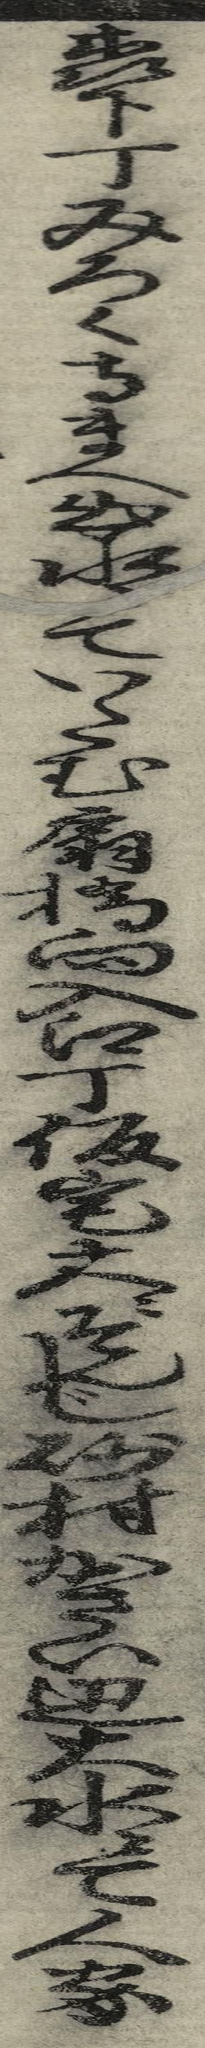森下丁みろく寺まへ出水にていたむ扇橋向入江丁仮宅大二そんじ砂村かさい辺大水二て人家
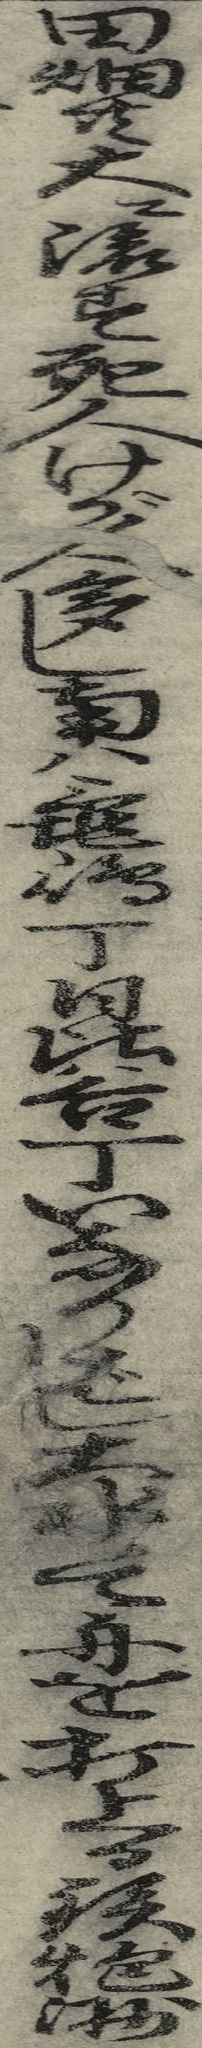田畑共大二流す死人怪我人多し南ハ亀嶋丁日比谷丁いなりばし大水二て舟を打上る鉄炮洲
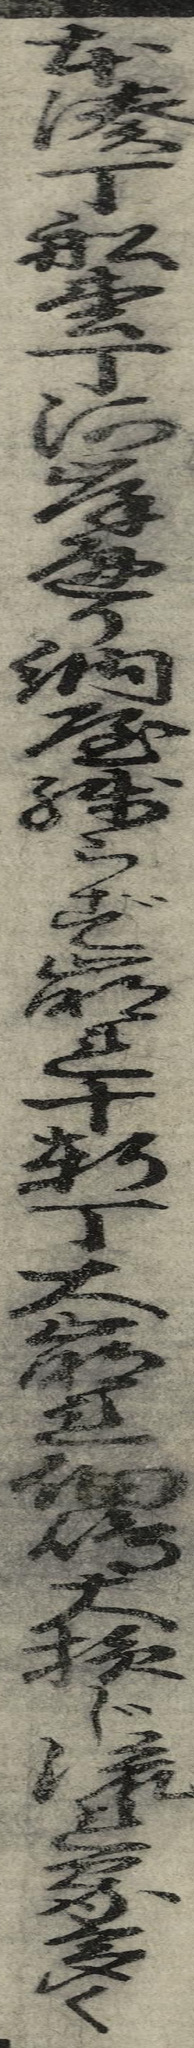本湊丁舟松丁河岸通り納屋残らず崩れ十軒丁大崩れ佃嶋大損じ流家多く
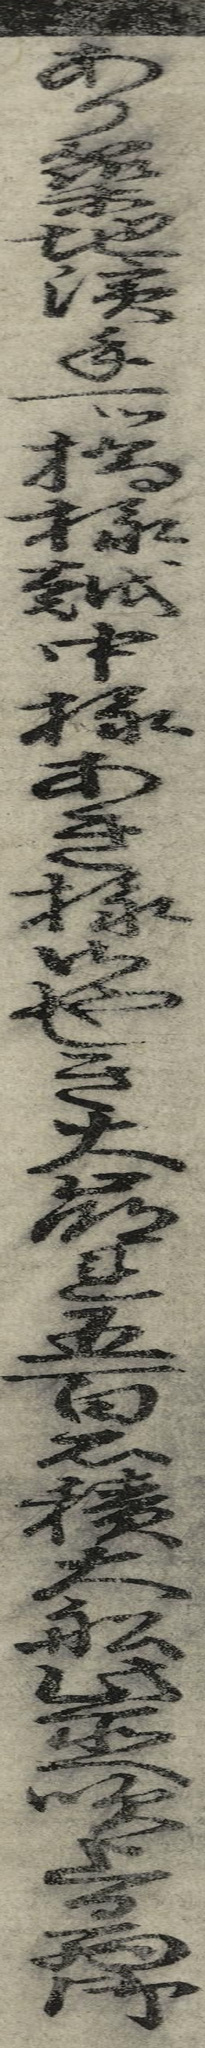あり築地濱手一ッ橋様越中様あき様御やしき大崩れ五百石積大船此所へ吹上る西御
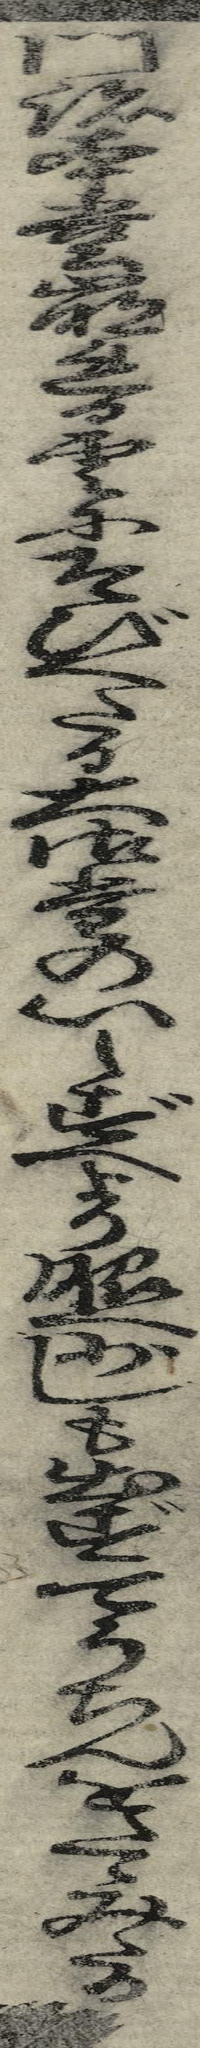門跡本道崩れる雲にそびへたる大御本堂のいしずへより脇へ少しも出ずてうちんをたゝみたる
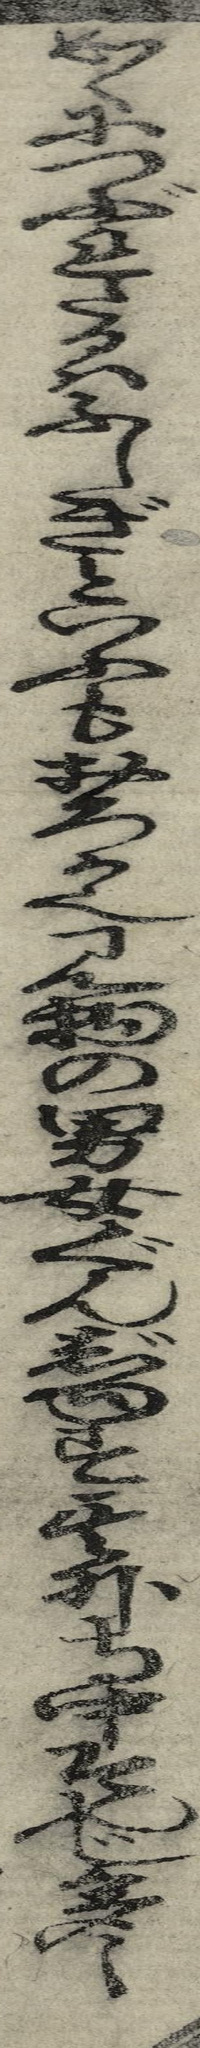如くにつぶれたるハふしぎといふもおろか也見物の男女ぐんじゆす其外寺中そんじ多し
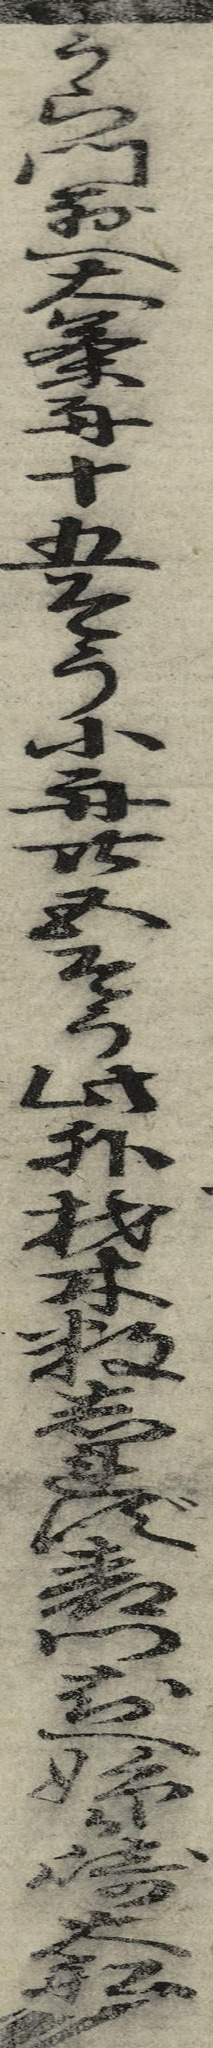うら門前へ大茶舟十五そう小舟廿五そう此外材木数しれず表門前へ姉ヶ崎大船
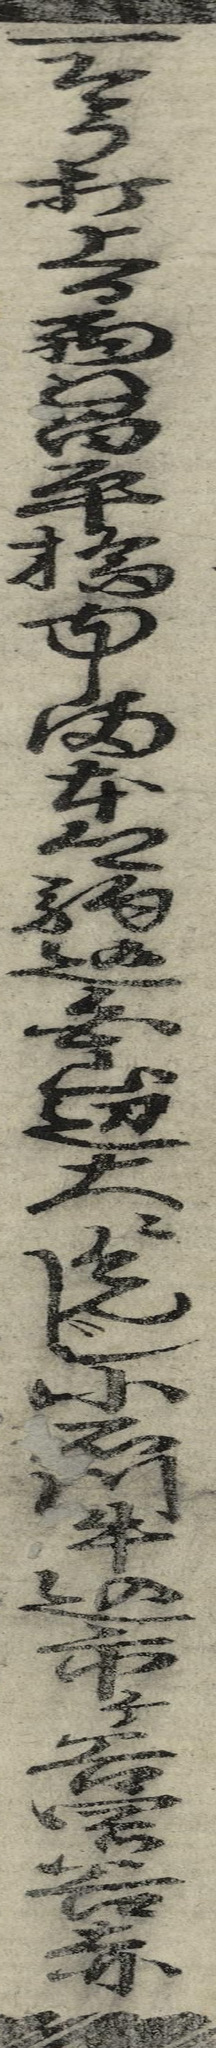一そう打上る西昌平橋ゆしま本郷駒込白山辺大二そんじ小石川牛込市ヶ谷四ッ谷赤
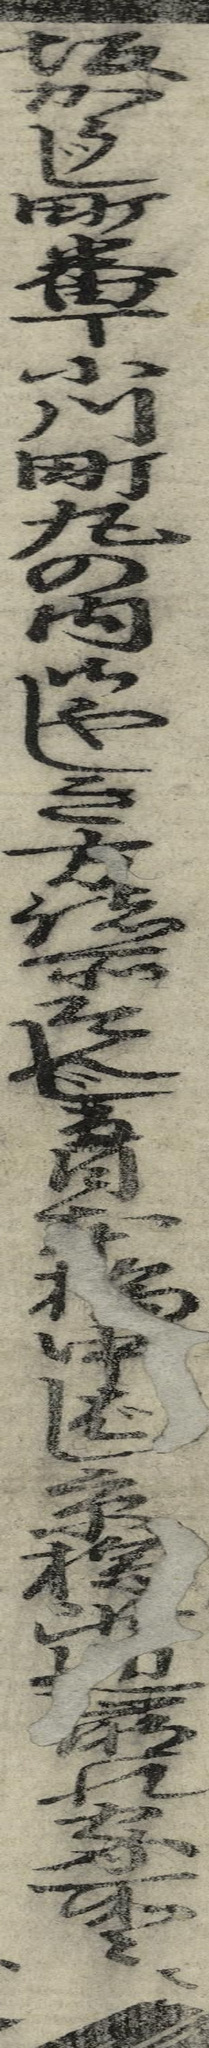坂かうし町番丁小川町丸の内御やしき方諸所そんじる日本橋中ばし京橋辺崩れ家所々
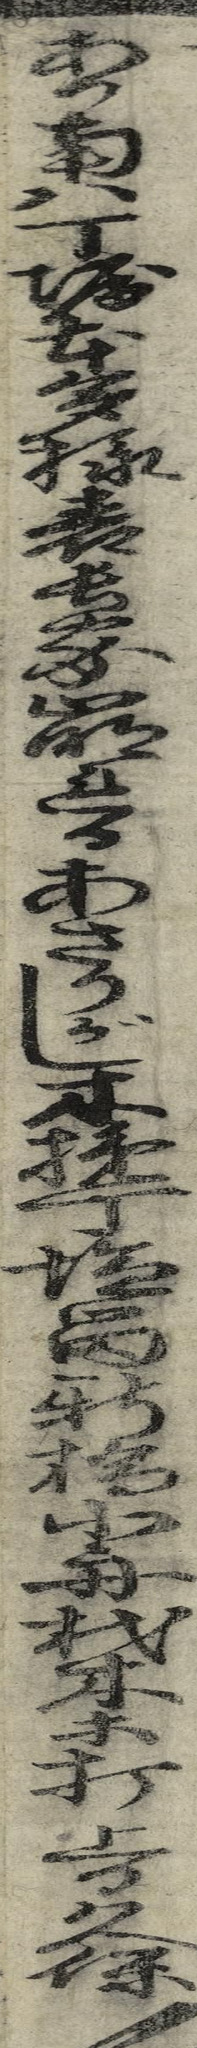あり南八丁堀本多様表長屋崩れるあさりがし木挽丁塩留新橋小舟材木打上る久保
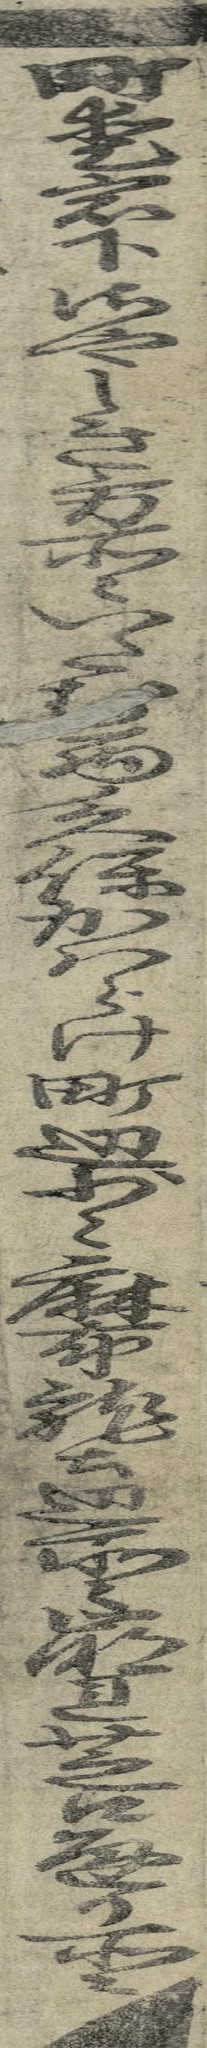町愛宕下御やしき方所々いたむ西久保かハらけ町辺少々麻布龍土辺所々崩れ芝口通り所々
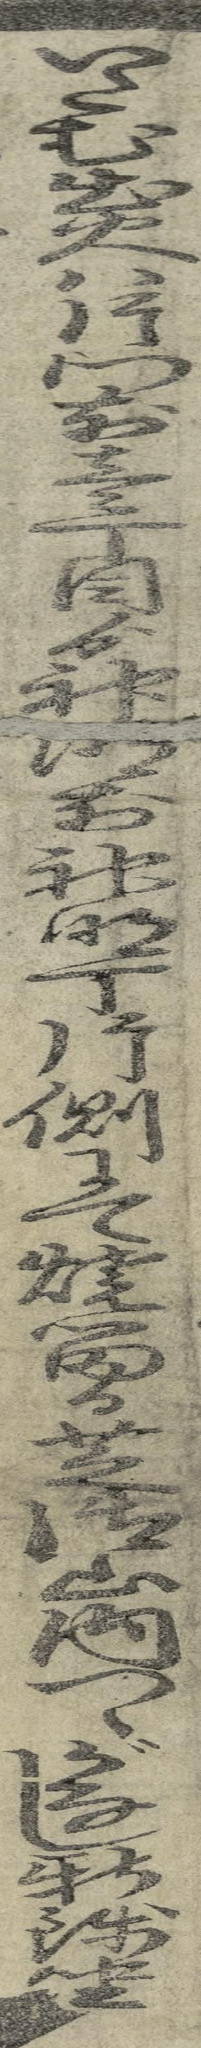いたむ出火ハ片門前壱丁目ゟ神明前神明丁片側にて焼留る芝御山内つゝがなし新銭座
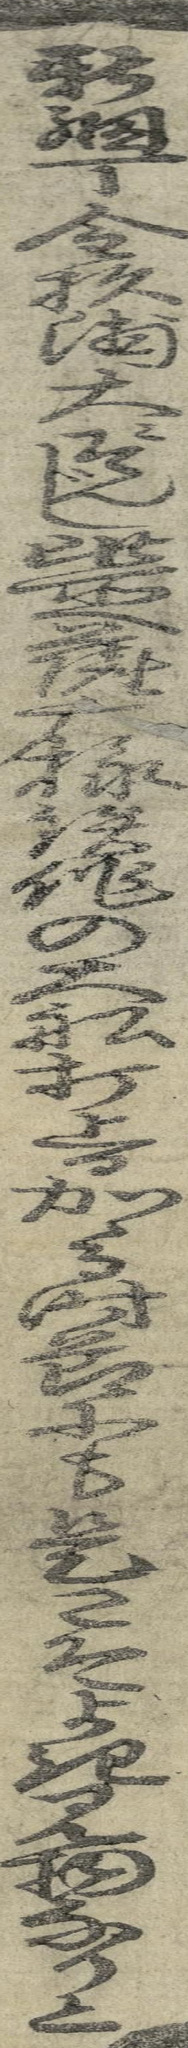新網丁金杉浦大二そんじ此所へ薩摩様鉄造の大船打上るかゝる時節にも是こそよき見物なりと
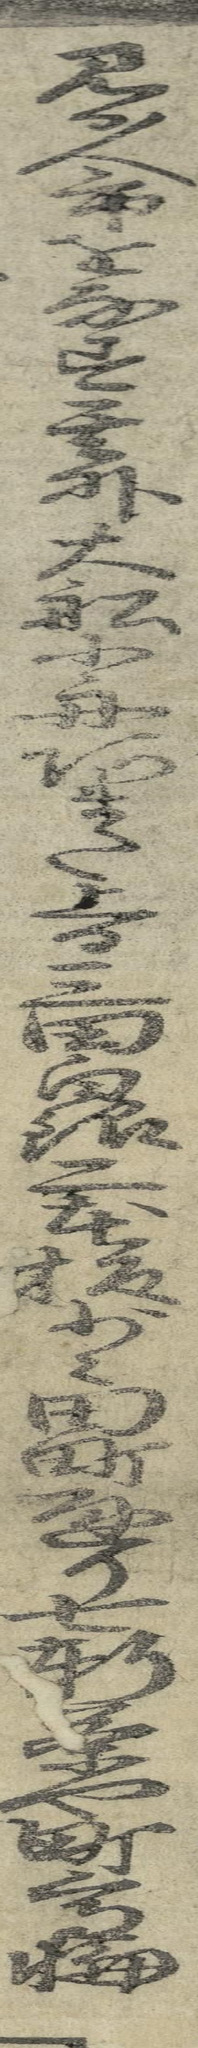見る人市をなす其外大船小舟あまた上る三田白銀二本松少々田町通り七軒茶や町高輪
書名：安政三辰八月廿五日　大風雨出水損場所之圖
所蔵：東京大学地震研究所図書室 Earthquake Research Institute Library, The University of Tokyo, JAPAN
